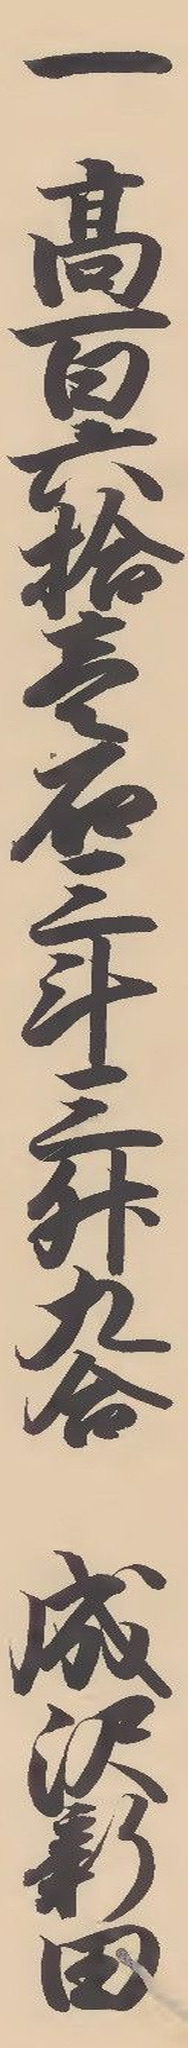一高百六拾壱石三斗三升九合成沢新田
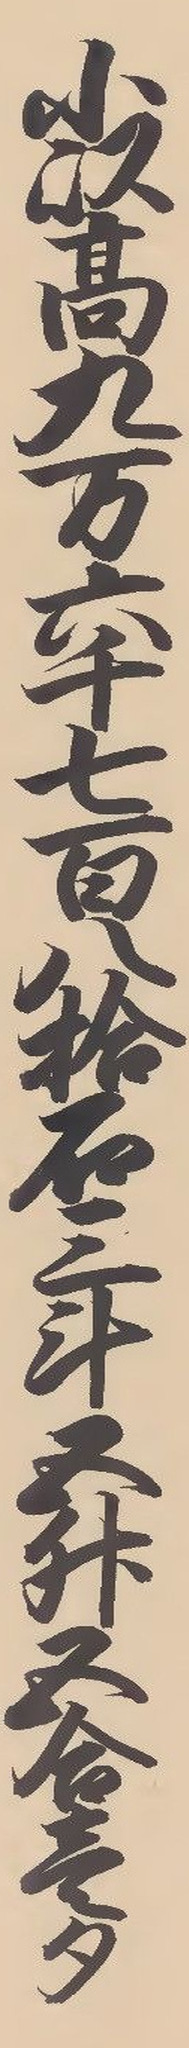小以高九万六千七百八拾石三斗五升五合壱勺
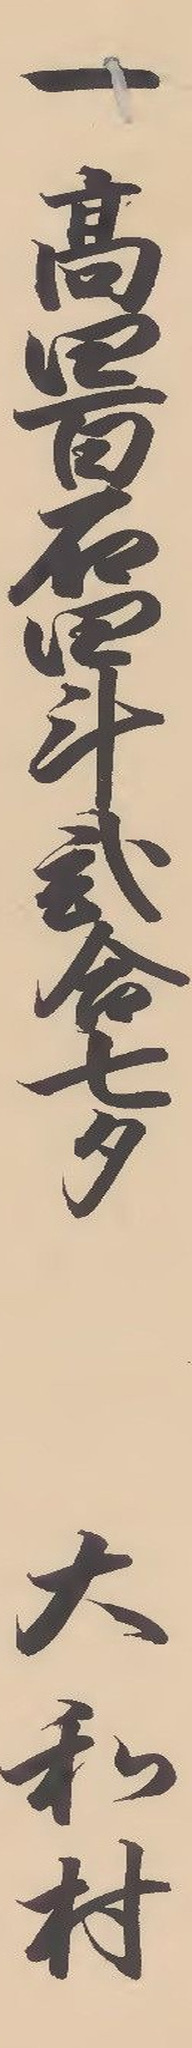一高四百石四斗弐合七勺大和村
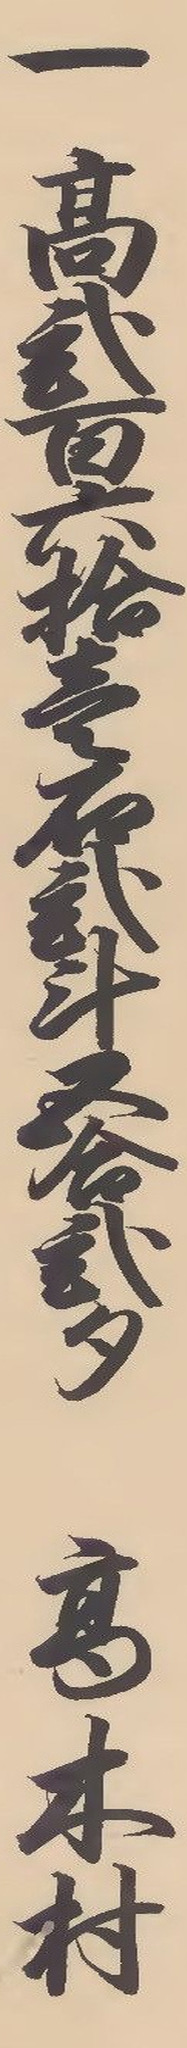一高弐百六拾壱石弐斗五合弐勺高木村

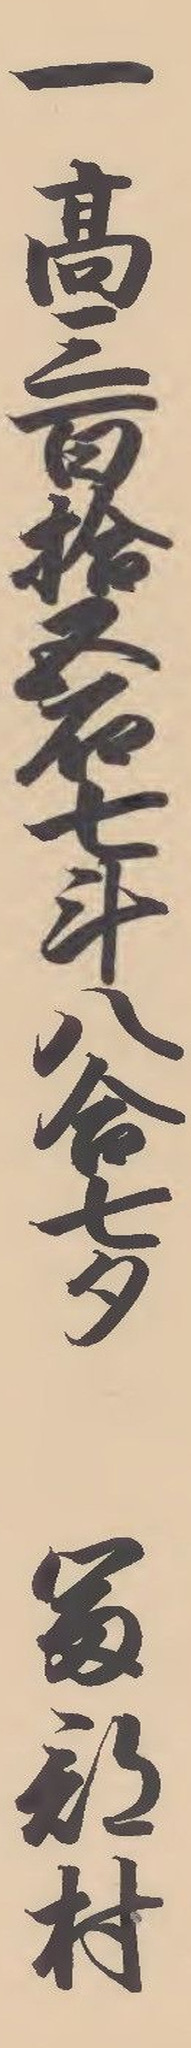一高三百拾五石七斗八合七勺富部村
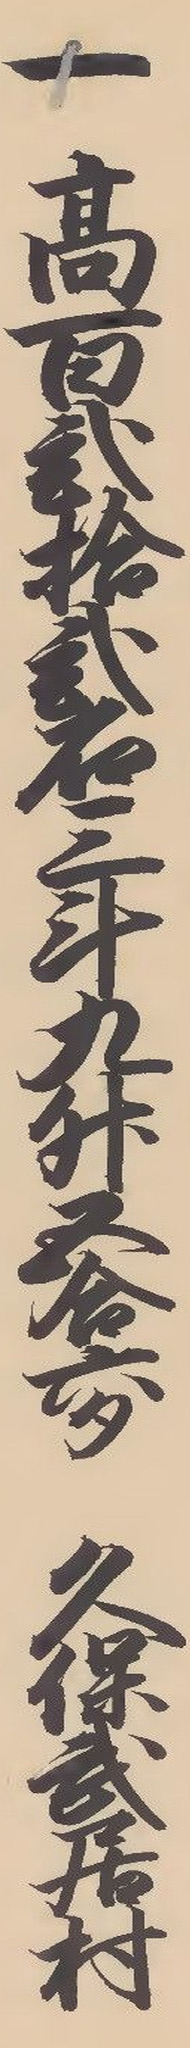一高百弐拾弐石三斗九升五合六勺久保武居村
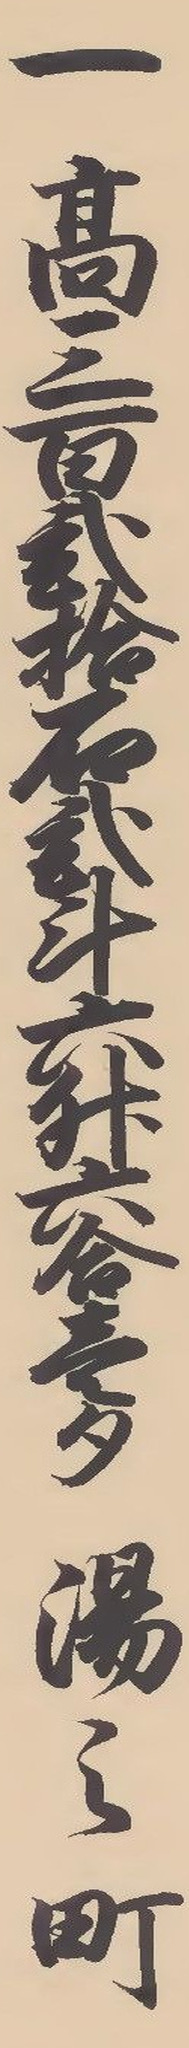一高三百弐拾石弐斗六升六合壱勺湯之村
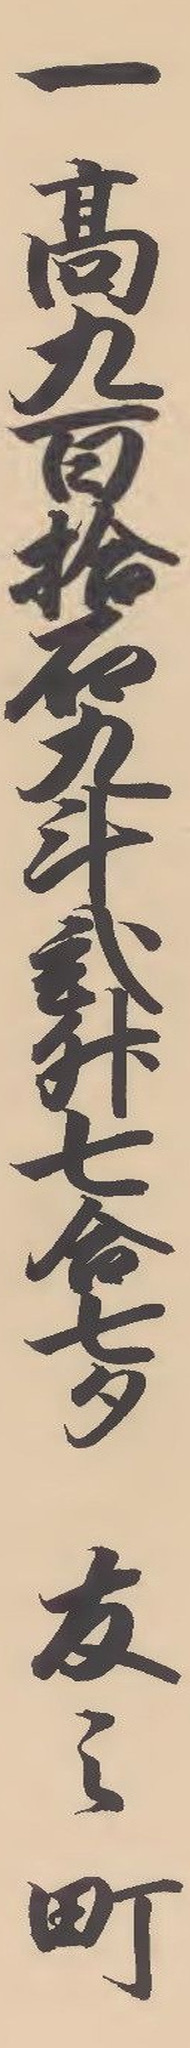一高九百拾石九斗弐升七合七勺友之村
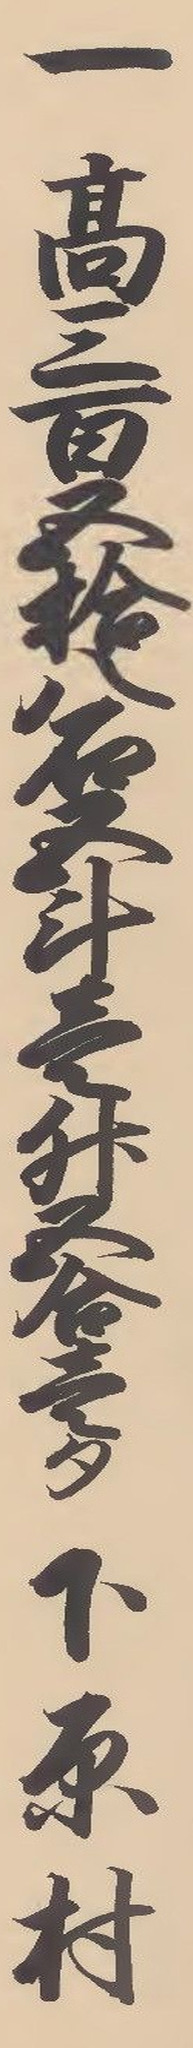一高三百五拾八石五斗壱升五合壱勺下原村
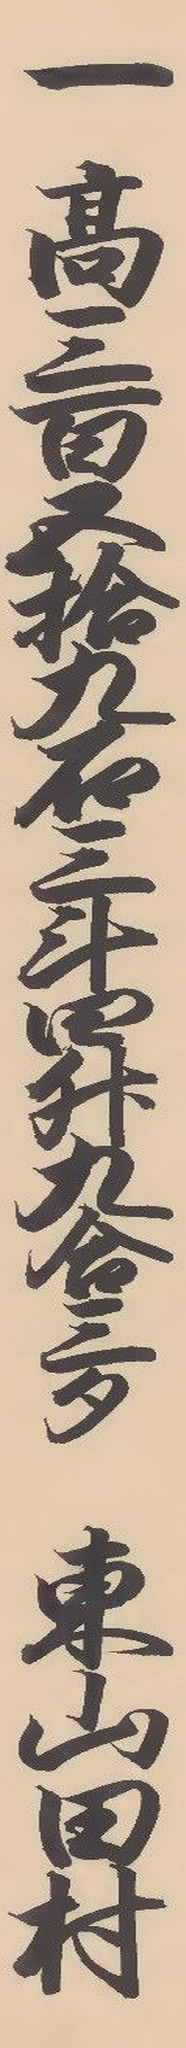一高三百五拾九石三斗四升九合三勺東山田村
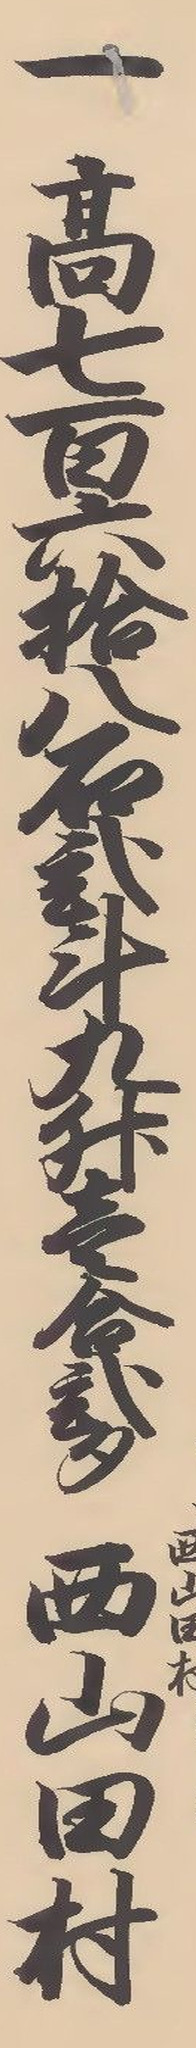一高七百六拾八石弐斗九升壱合弐勺西山田村
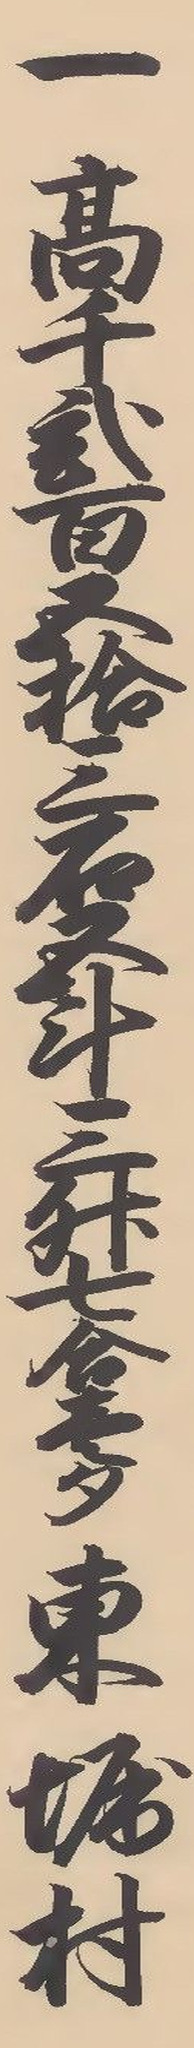一高千弐百五拾三石五斗三升七合壱勺東堀村

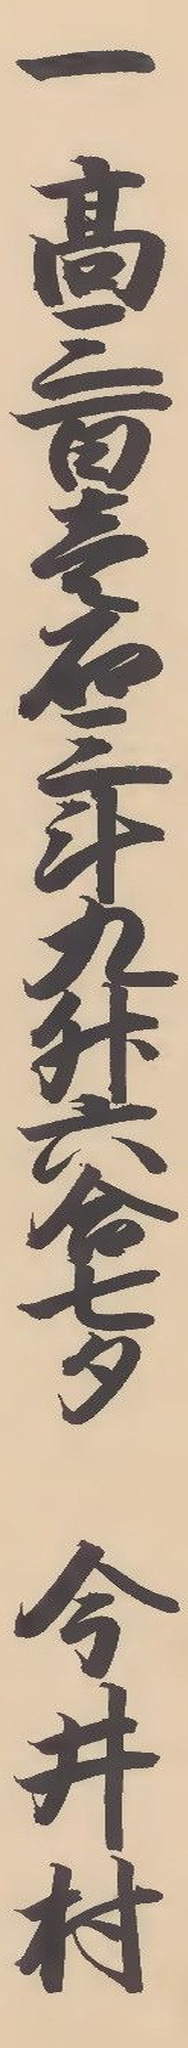一高三百壱石三斗九升六合七勺今井村
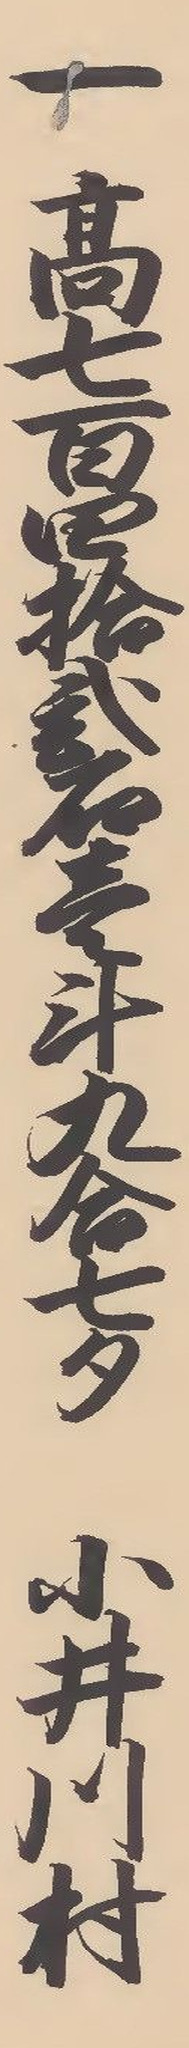一高七百四拾弐石壱斗九合七勺小井川村
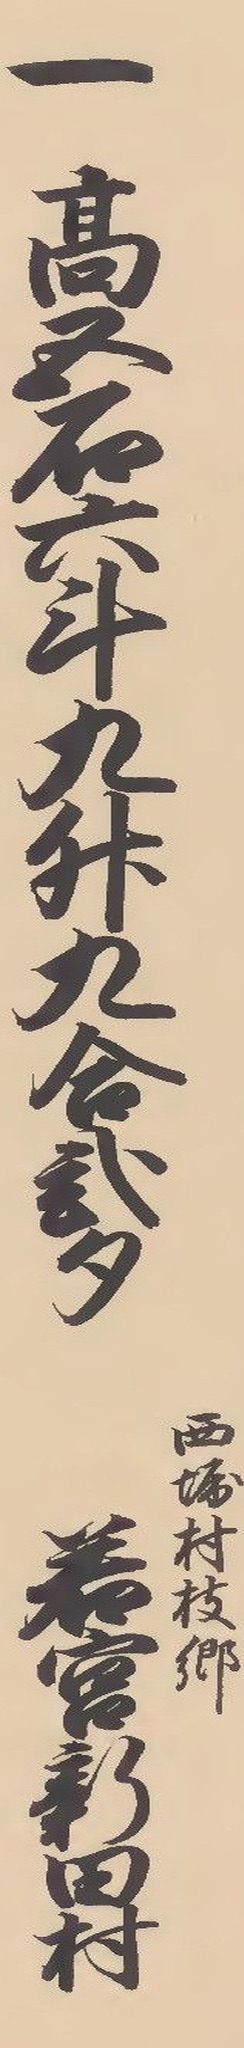一高五石六斗九升九合弐勺若宮新田村
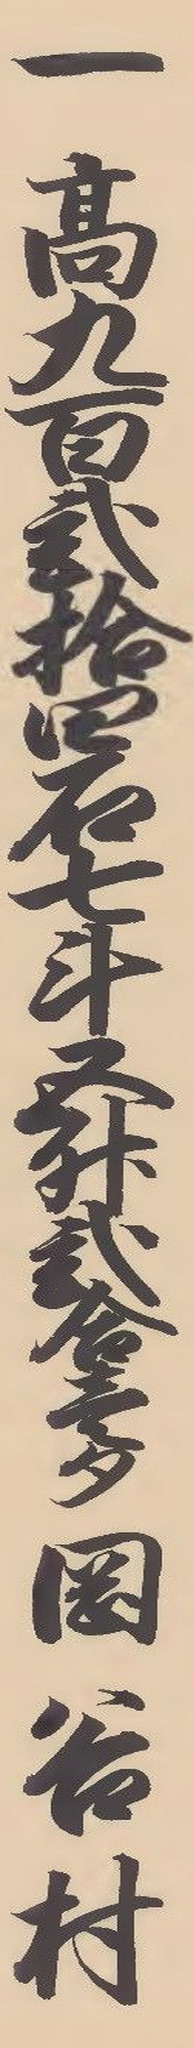一高九百弐拾四石七斗五升弐合壱勺岡谷村
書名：信濃国郷帳
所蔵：国立公文書館 National Archives of Japan
